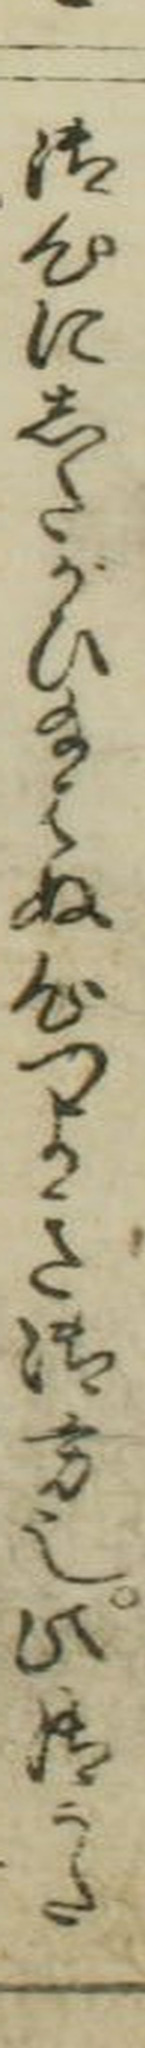御心にしたがひ給はぬ心つよき御方也。此御かた
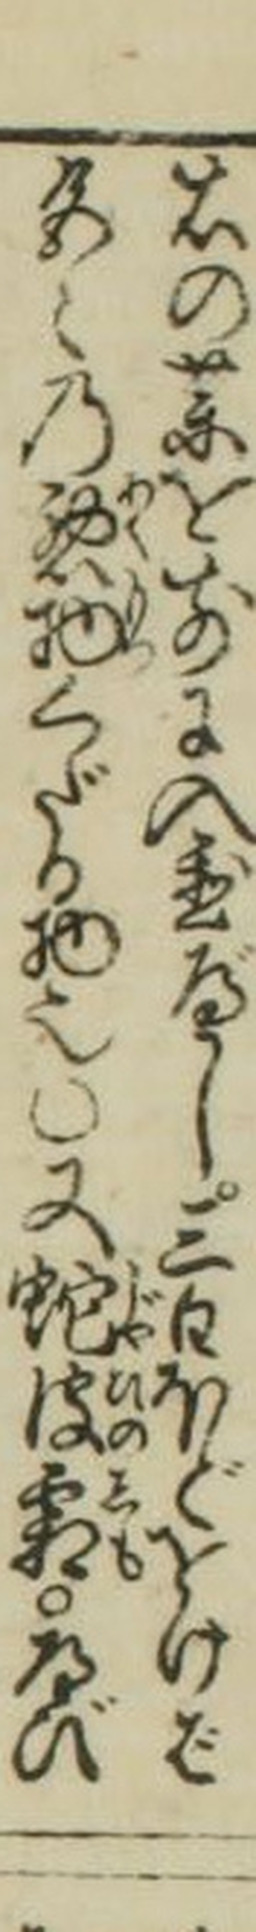色々の悪物くだる物也◯又蛇皮霜◯へび
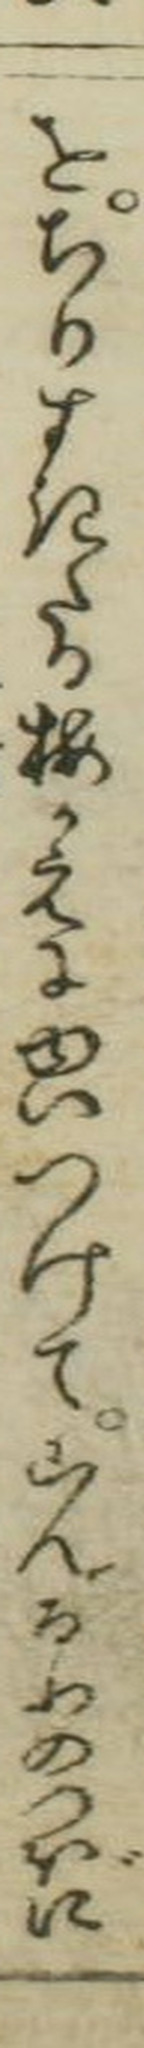を。ちりすきたる梅かえにゆいつけて。こんるりのつぼに
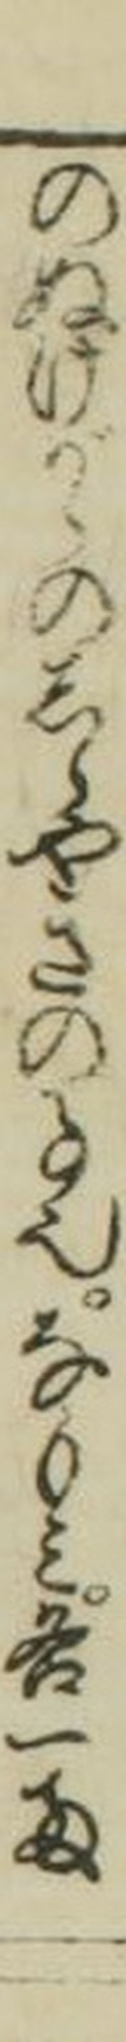のぬけがらのしらやきの事也。なもみ。各一両
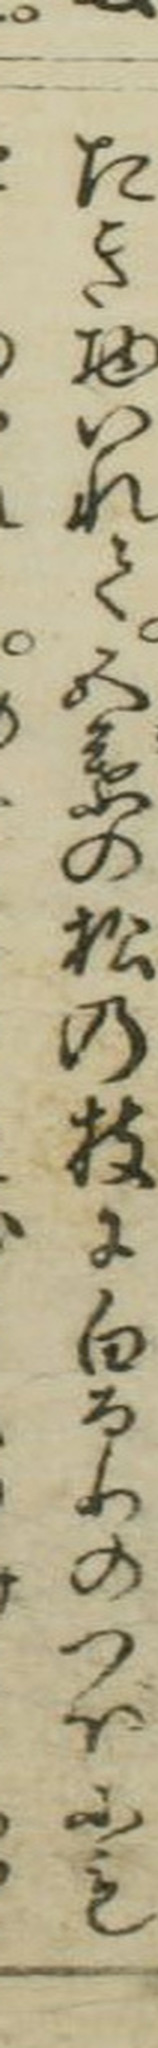たき物いれて。五葉の松の枝に白るりのつぼにも
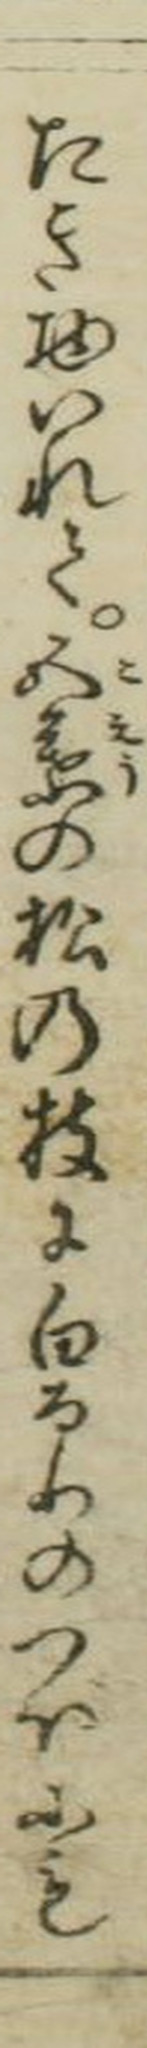たき物いれて。五葉の松の枝に白るりのつぼにも
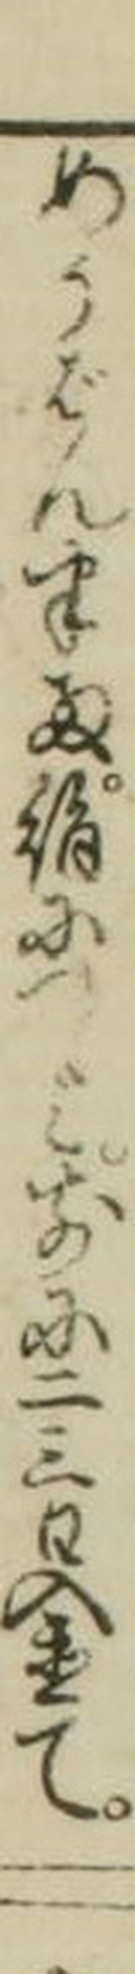めうばん半両。絹につゝみ。前に二三日入置て。
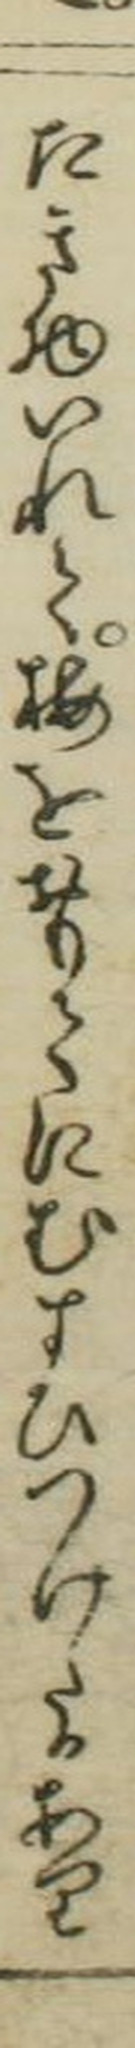たき物いれて。梅をおもてにむすひつけたるあり
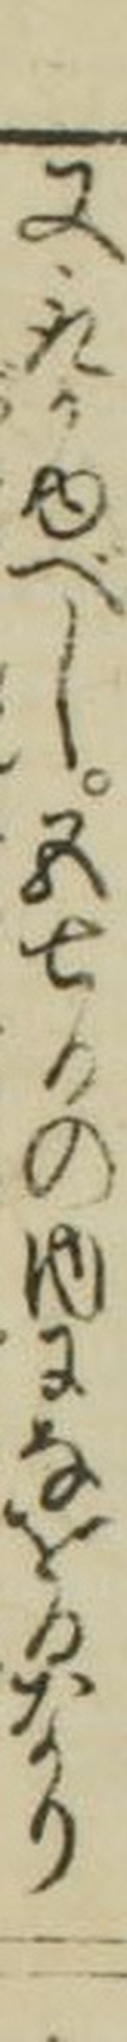又取かゆべし。五七日の内になをるなり
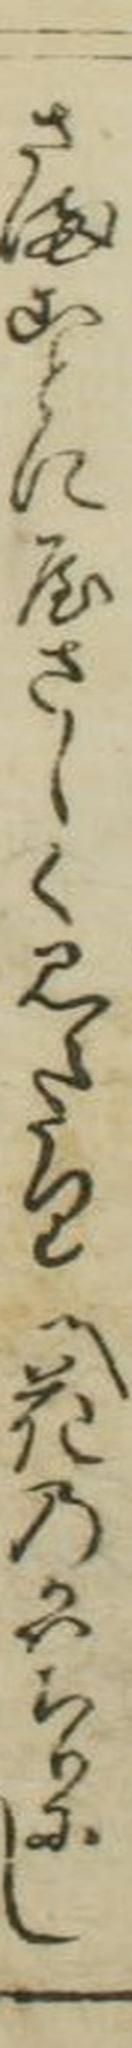さまことにやさしく見えたり〽花のかはちりにし
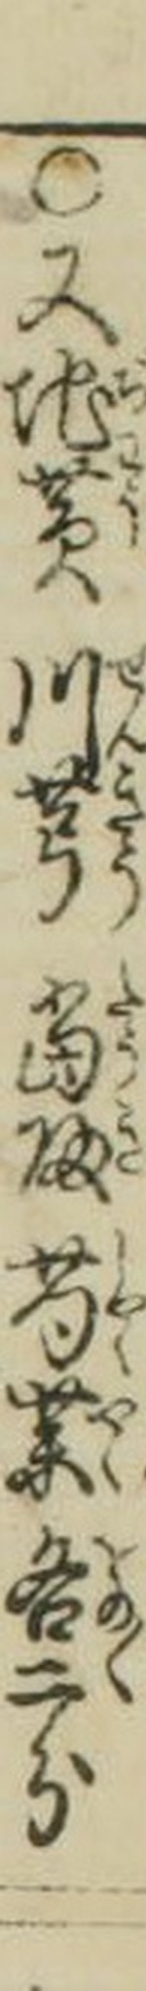◯又地黄川芎当帰芍薬各二分
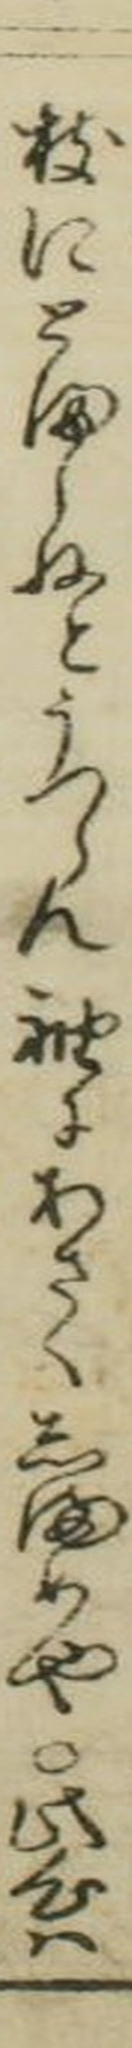枝にとまらねとうつらん袖にあさくしまめや◯此心は
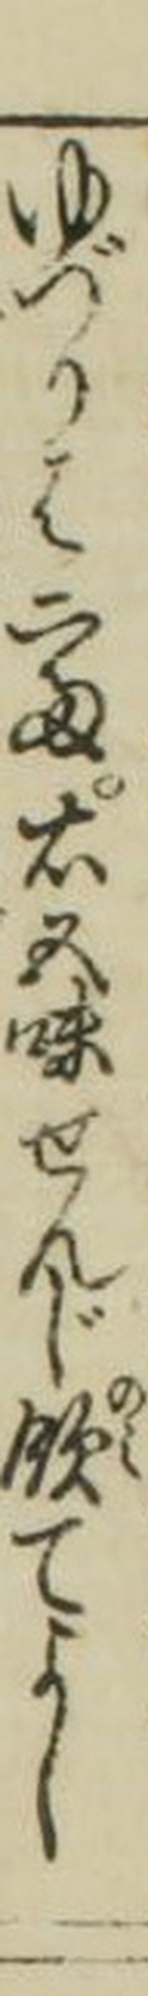ゆづりはニ両。右五味せんじ飲てよし
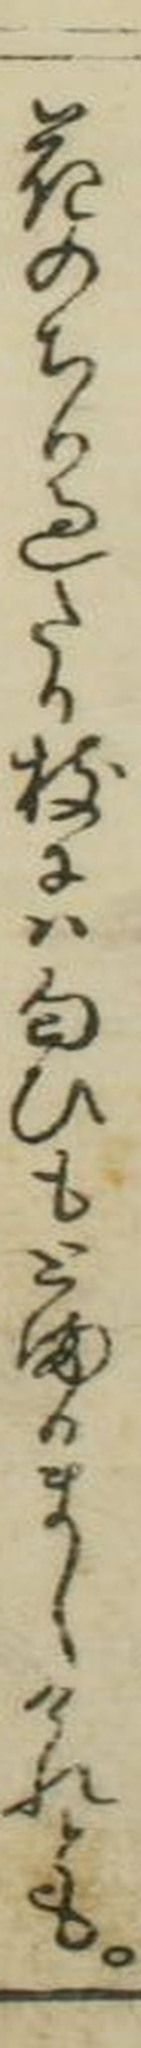花のちり過たる枝には匂ひもとまるましけれとも。
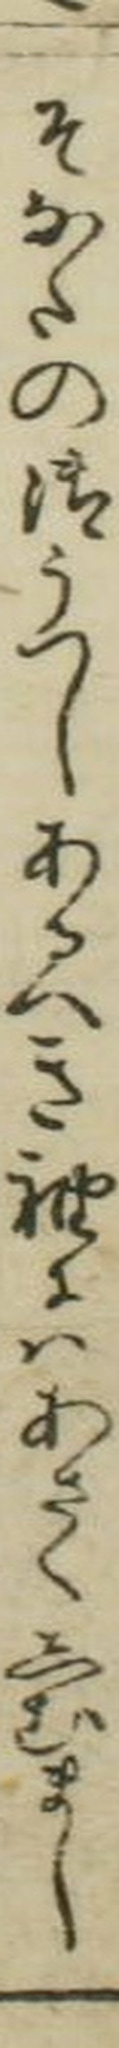そなたの御うつしあるへき袖にはあさくしむまし
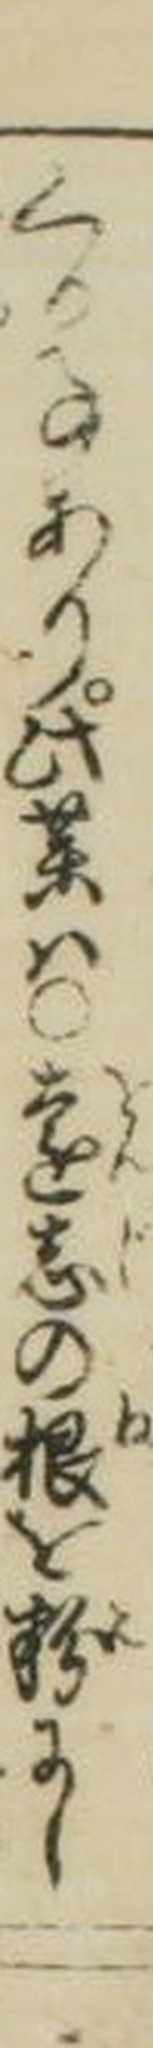くる事あり。此薬は○遠志の根を粉にし
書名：女源氏教訓鑑
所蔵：東京学芸大学附属図書館
